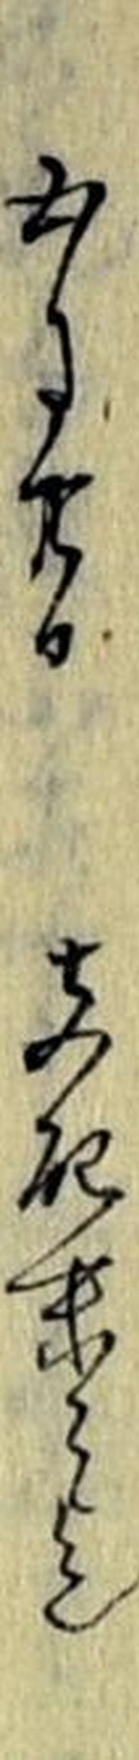五月廿日支配末々迄
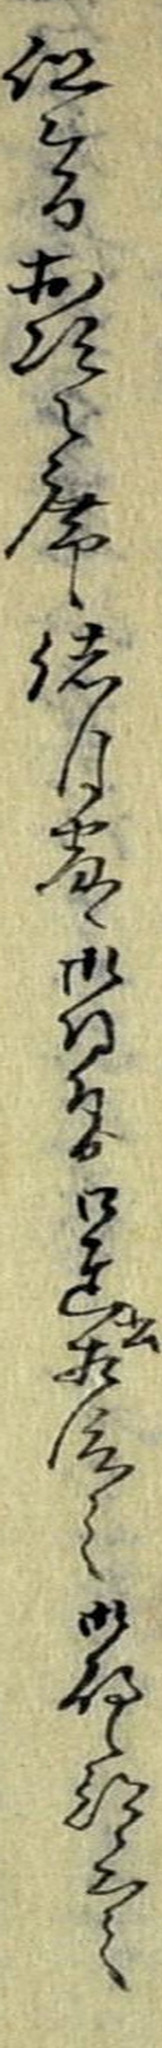但今日於次之席諸月番御目付ゟ口達書相渡之御触之部に出之
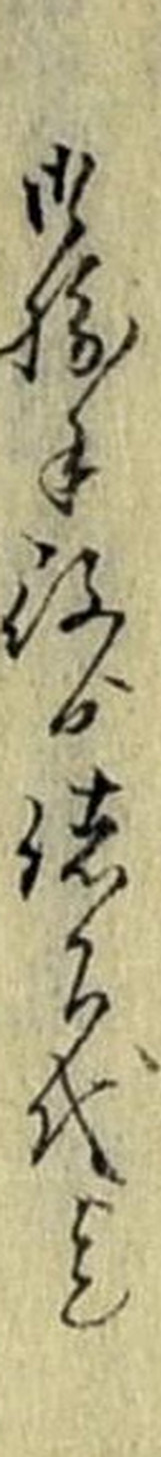御勝手役ゟ諸下代迄
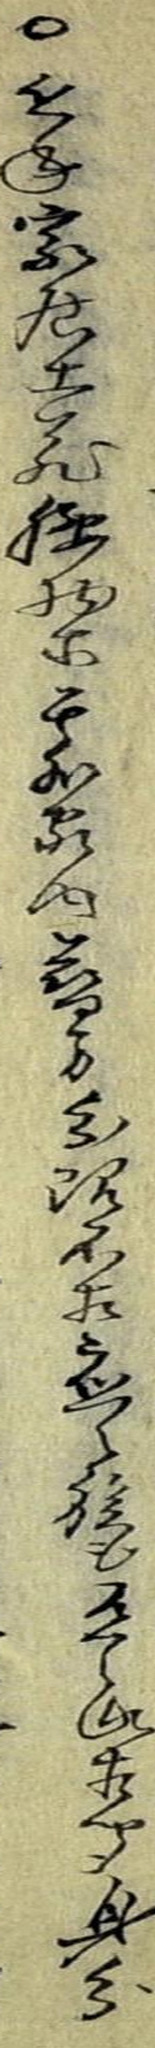○近年家居土蔵腰物等其外家内暮方分限不相応之族も有之趣相聞身分
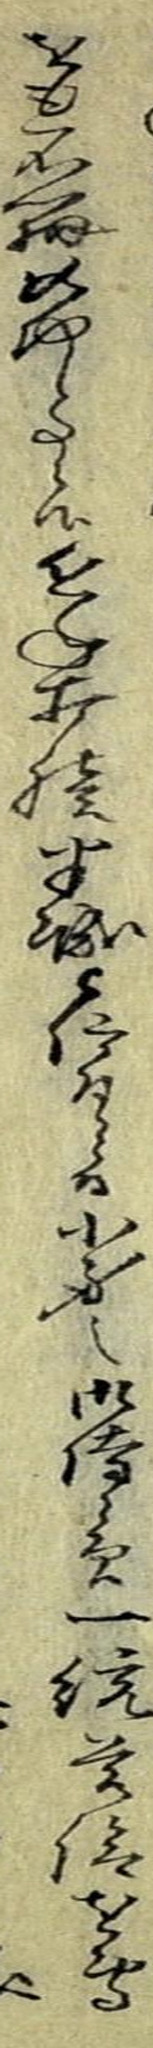をも不弁如何之事に候近年打続半減被仰付候に付小身之御侍に而は一統節倹を専
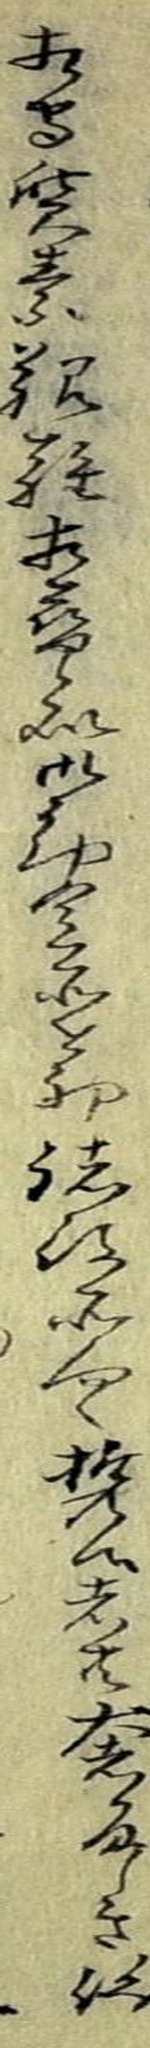相守質素艱難相暮候処御勘定所を初諸役所向へ携候者共奢ましき儀
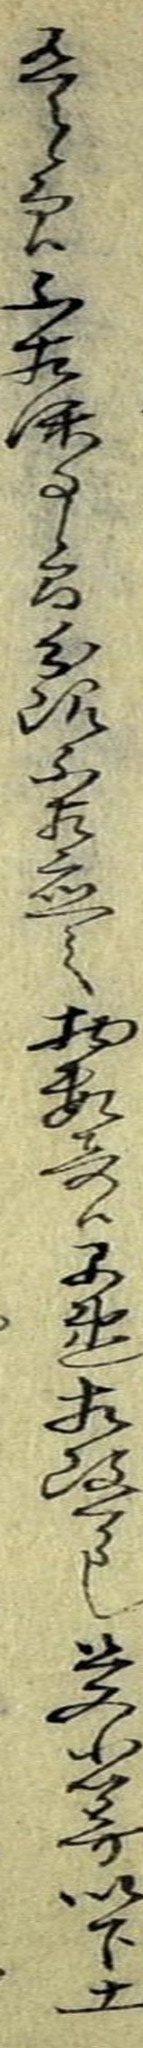有之候而は不相済事候間分限不相応之物数奇は早速相改可申候且又小算以可土
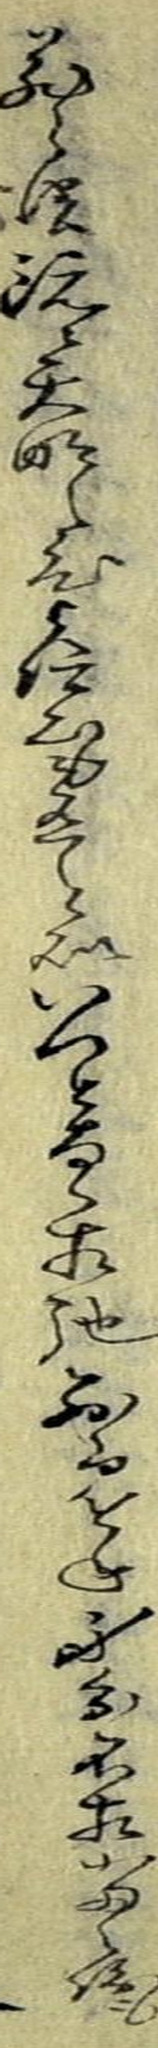蔵之儀は既に天明之度被仰出も有之候処いつとなく相弛別而近年見分不相当之儀も
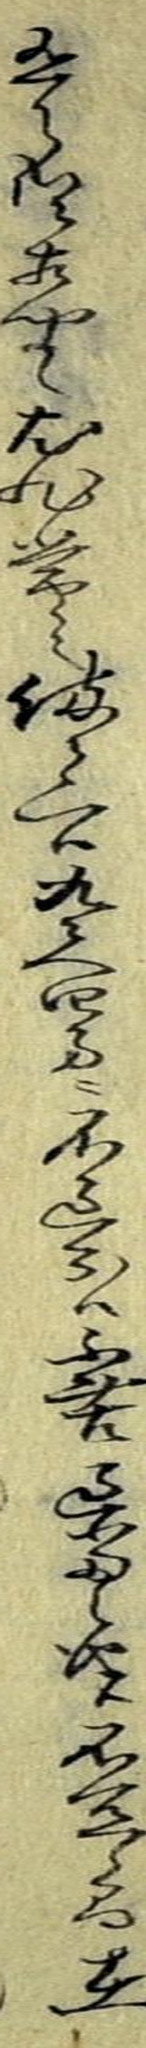有之哉に相聞候尤非常之備に候はヽ九尺四方に不過分は不苦過当之儀は不宜候間在
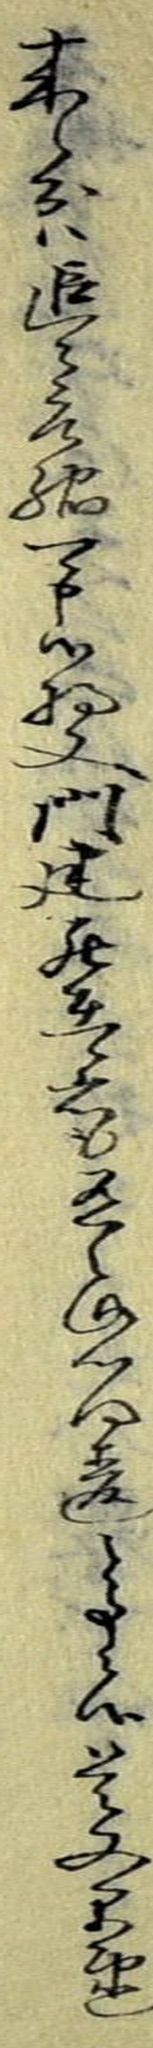來之分は追々取縮可申候猶又門建罷在候者も有之趣心得違之事に候是又早速

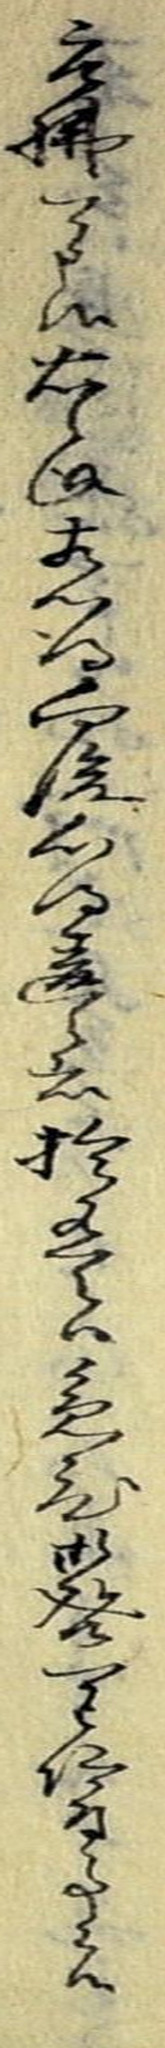取払可申候右之趣相心得向後心得違之物於有之は急度御咎可被仰付事に候
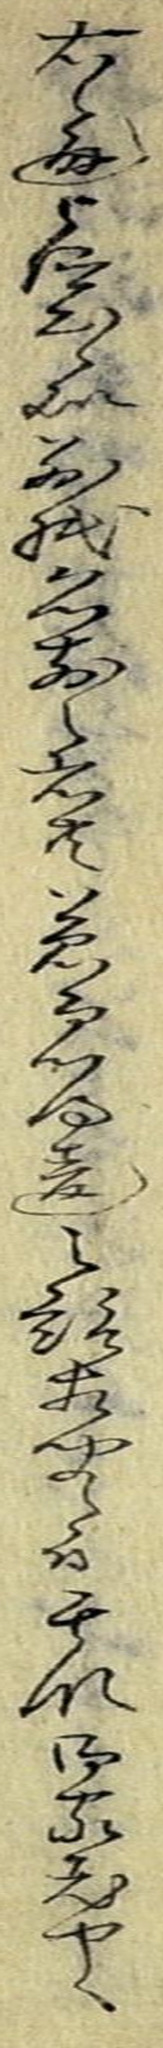右之通被仰出候処別紙之者共兼而心得違之趣相聞候に付其段御家老中
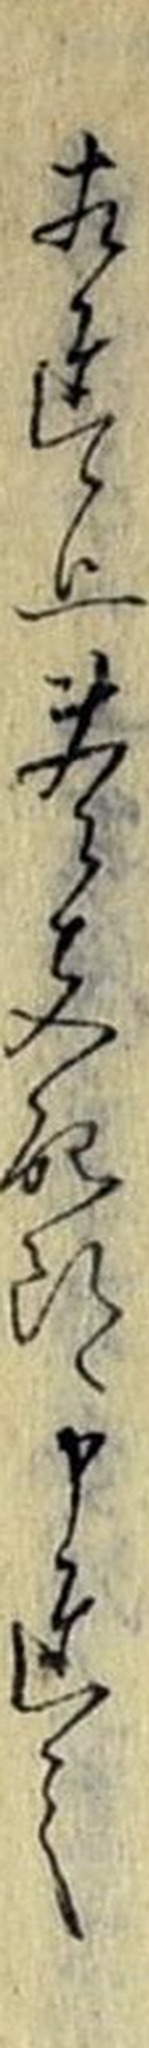相達候上夫々支配頭へ申達之
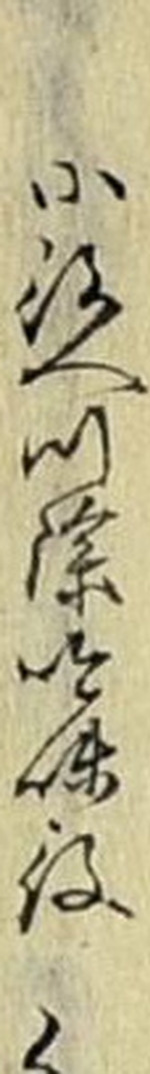小役人川除吟味役
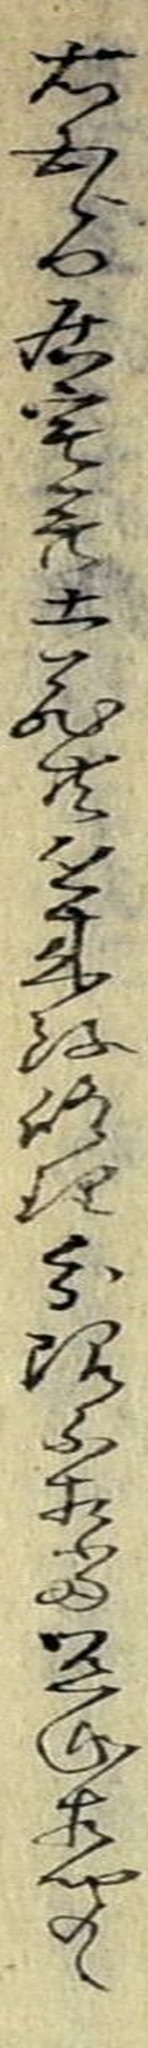右五郎右衛門居宅并土蔵共近来致修理分限不相当宜趣相聞候
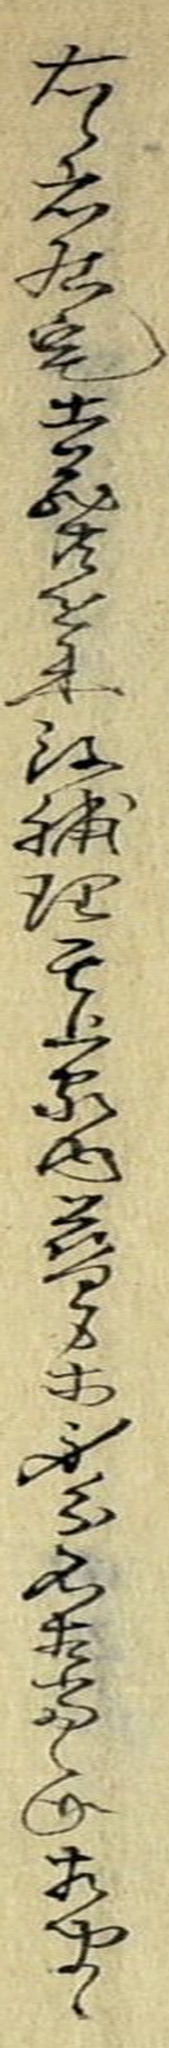右之者居宅土蔵共近来致補理其上家内暮方等身分不相当之趣相聞候
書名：命令之部 六
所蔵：福井県文書館 Fukui Prefectural Archives
